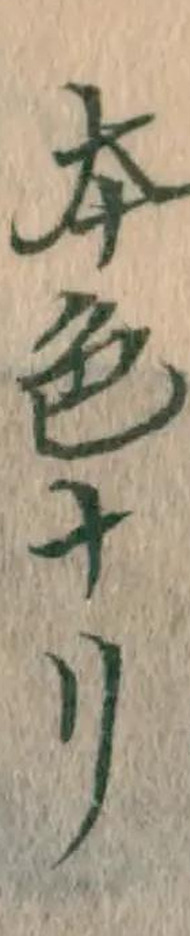本色ナリ

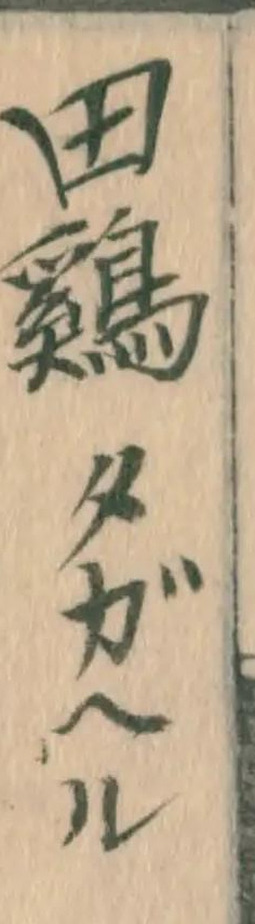田鶏タガヘル
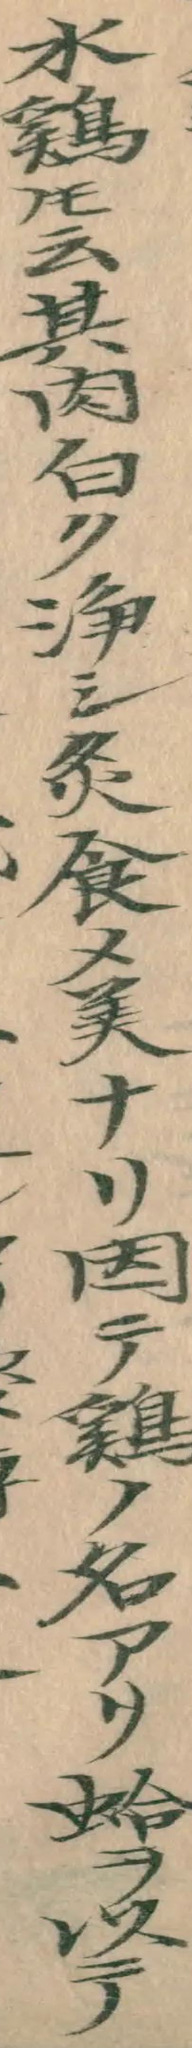水鶏トモ云其肉白ク浄シ炙食シテ美ナリ因テ鶏ノ名アリ蛤ヲ以テ
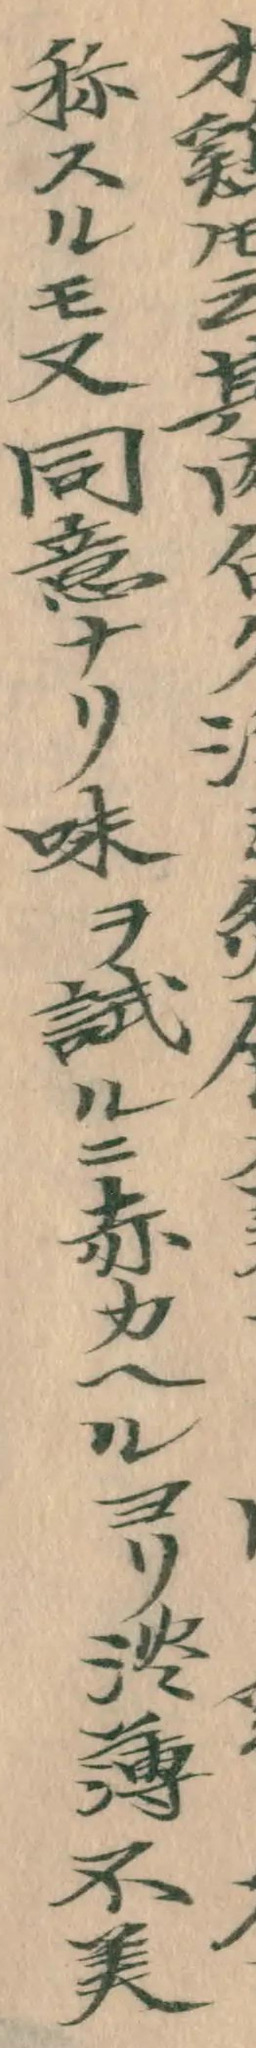称スルモ又同意ナリ味ヲ試ルニ赤カヘルヨリ淡薄不美
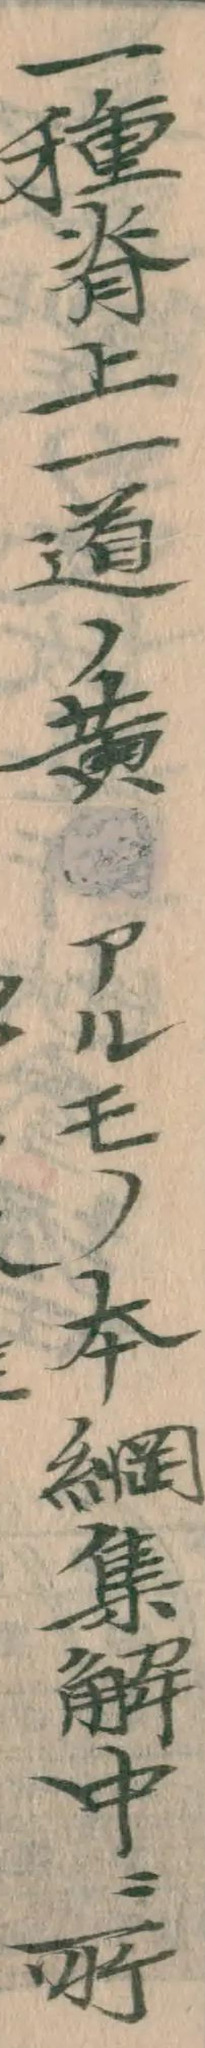一種脊上一道ノ黄アルモノ本綱集解中ニ所謂金線
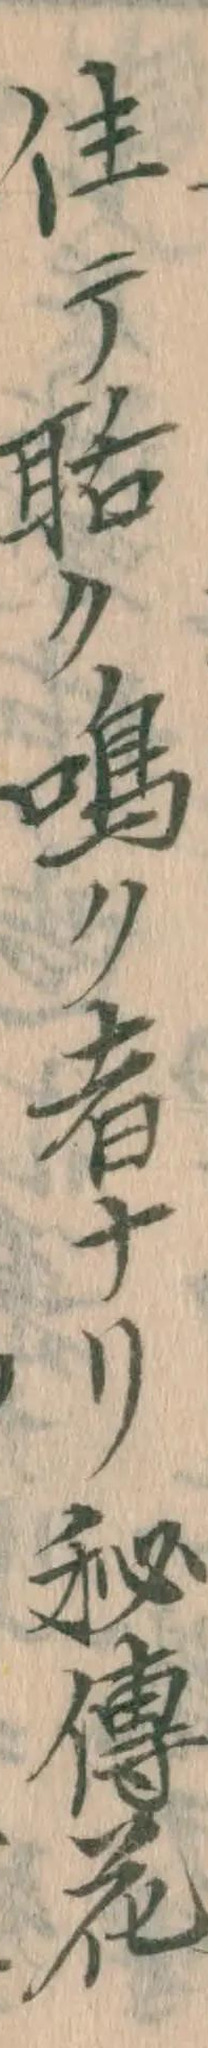住テ聒ク鳴ク者ナリ秘傳花
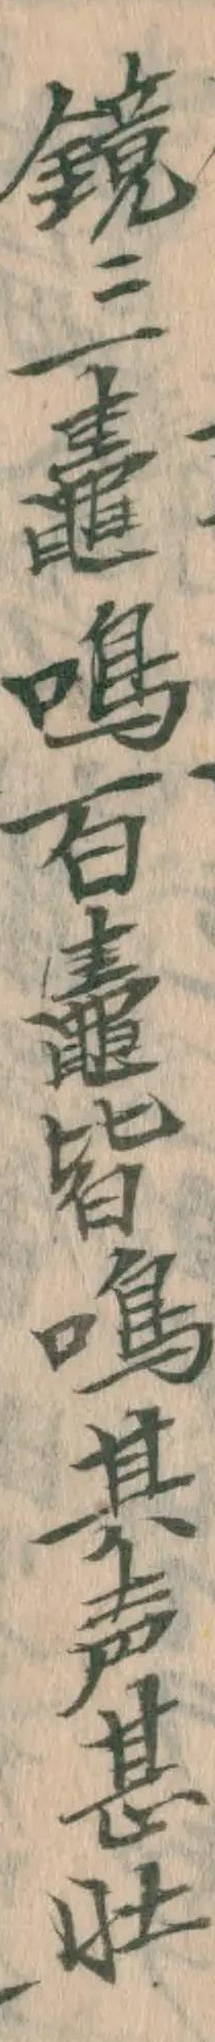鏡ニ一鼃鳴百鼃皆鳴其声甚壮
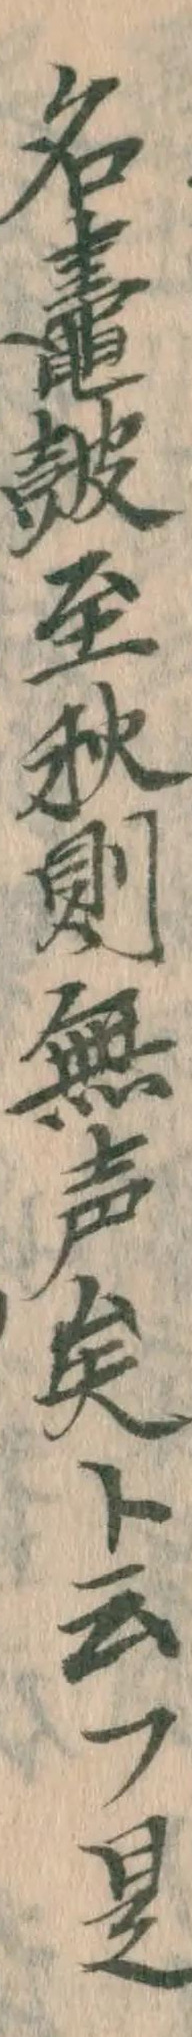名鼃皷至秋則無声矣ト云フ是
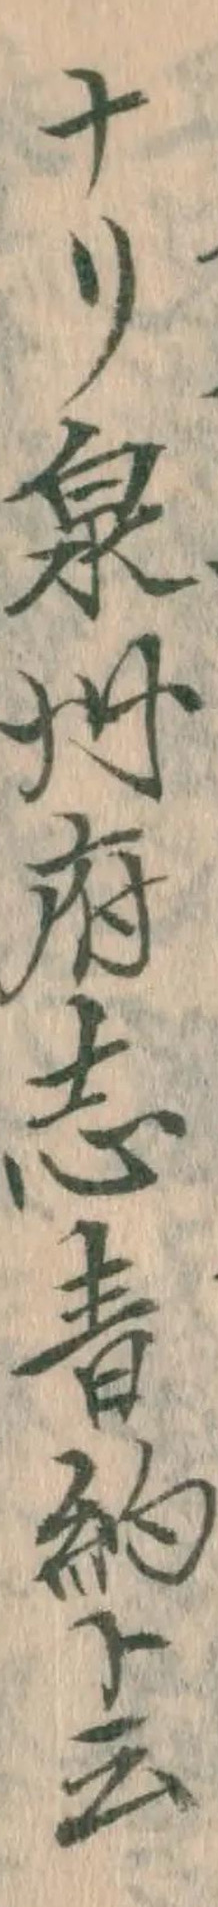ナリ泉州府志青約ト云
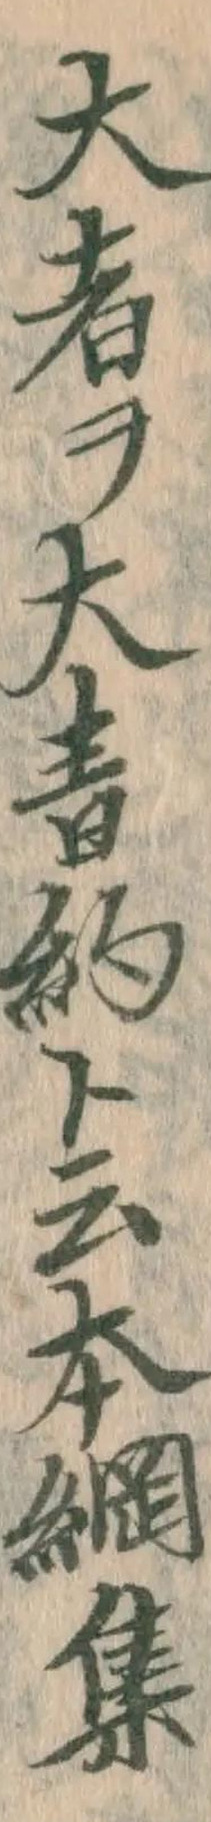大者ヲ大青約ト云本綱集
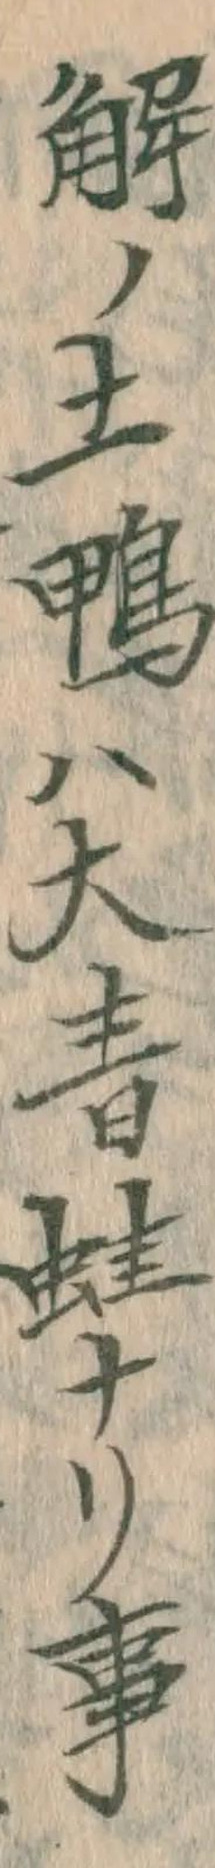解ノ土鴨ハ大青蛙ナリ事
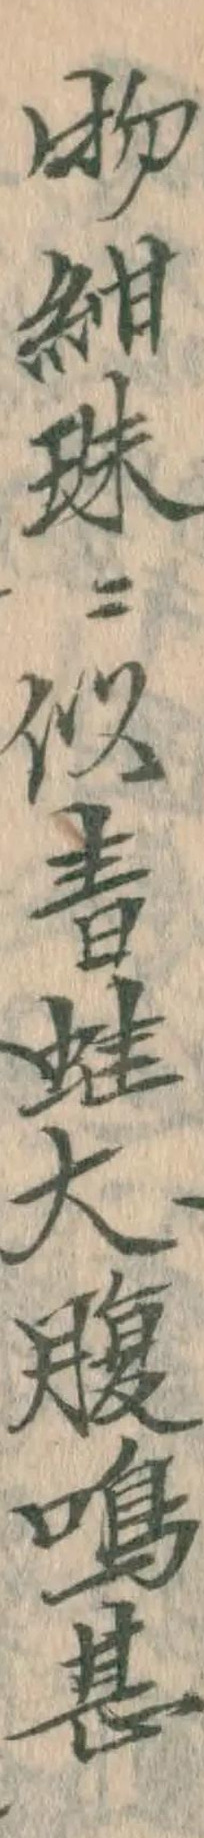物紺珠ニ似青蛙大腹鳴甚
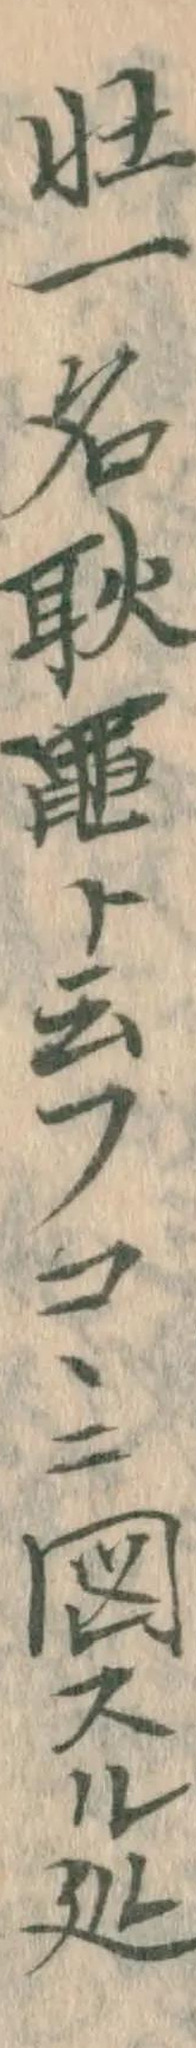壮一名耿黽ト云フコヽニ図スル処
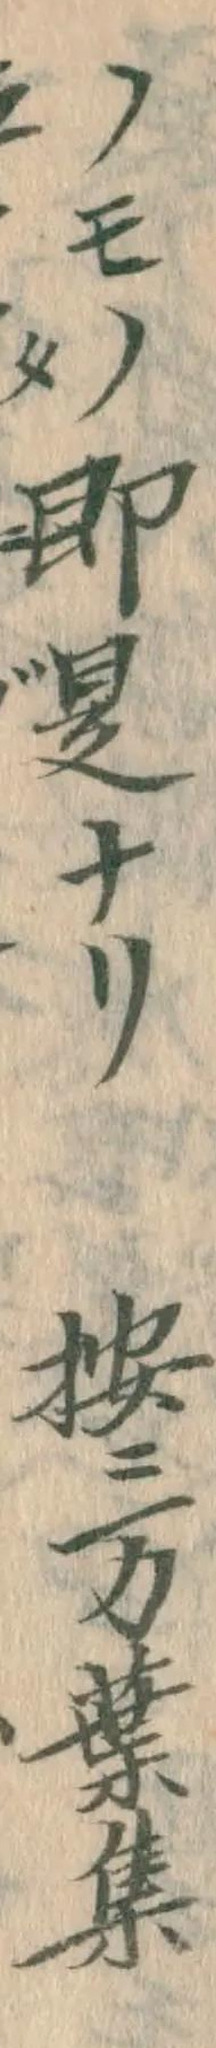ノモノ即是ナリ按ニ万葉集
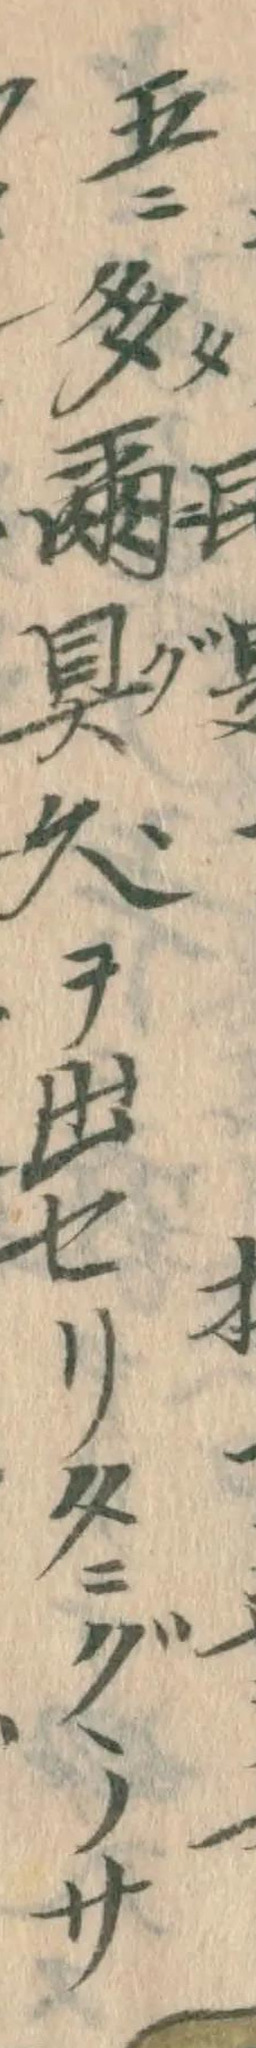五ニ多爾具久ヲ出セリタニグヽノサ
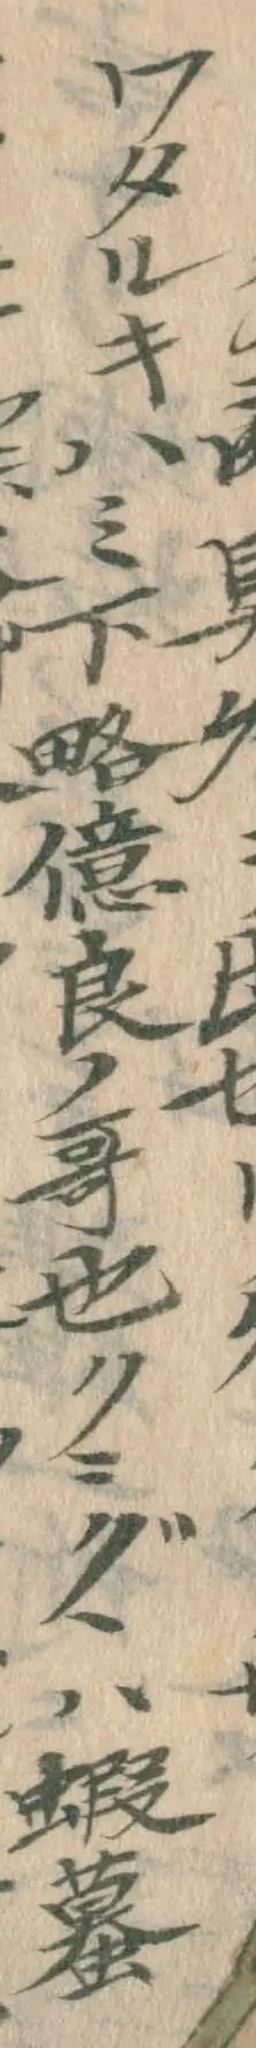ワタルキハミ下略億良ノ哥也クニグヽハ蝦蟇
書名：千蟲譜 3巻. [2]
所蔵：国立国会図書館 National Diet Library, JAPAN
